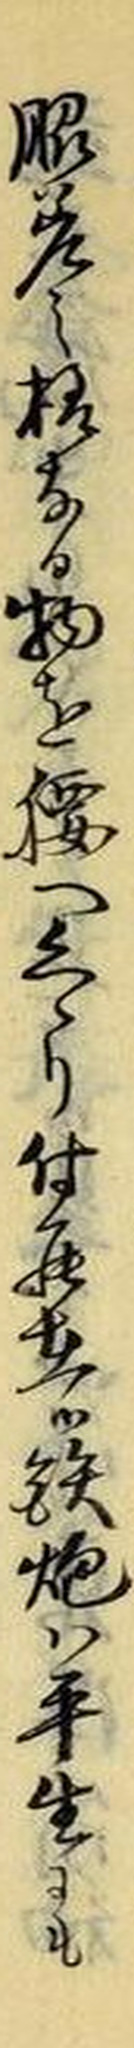脇差し様なる物を腰へくゝり付罷在候鉄砲は平生にも
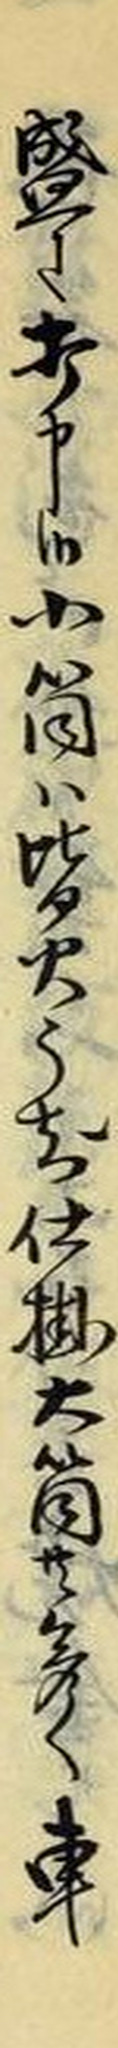盛に打申候小筒は皆火うち仕掛大筒共多く車
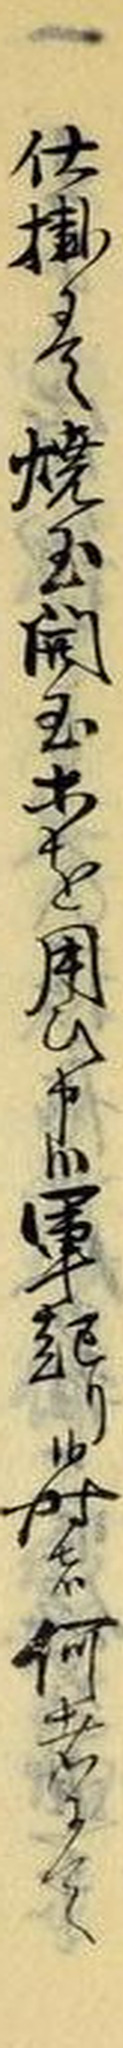仕掛けにて焼玉開玉等を用ひ申候軍起り候時者何者にて
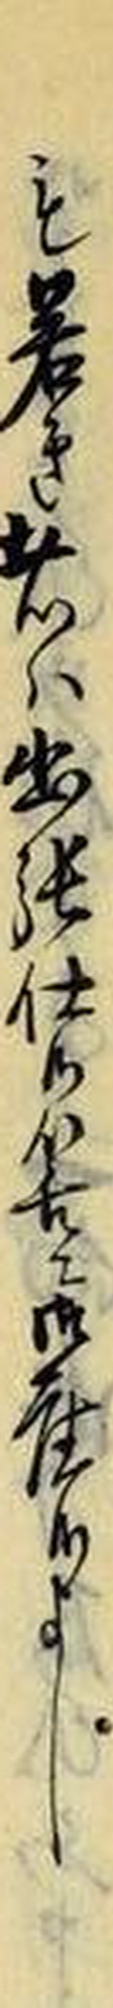も若き者ハ出張仕候筈ニ御座候よし
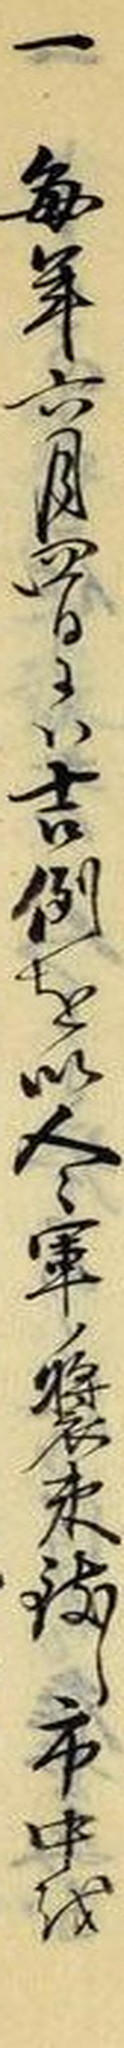一毎年六月四日にハ吉例を以人々軍ノ装束致し市中を
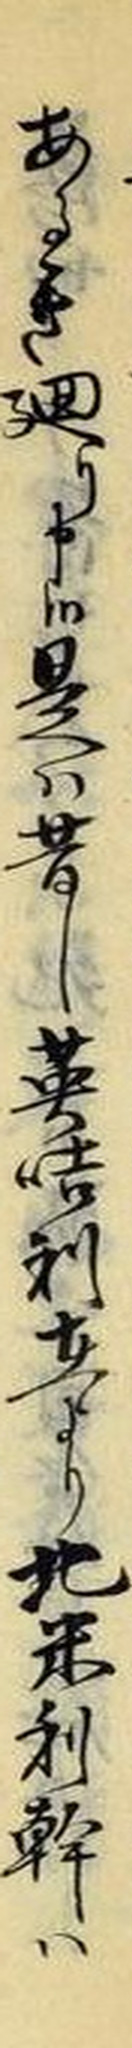あるき廻り申候是ハ昔し英吉利在より北米利幹ハ
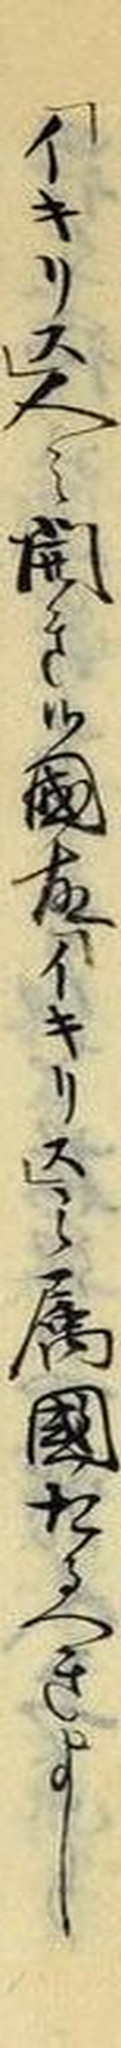「イキリス」人之開き候国故「イキリス」之属国たるへきよし
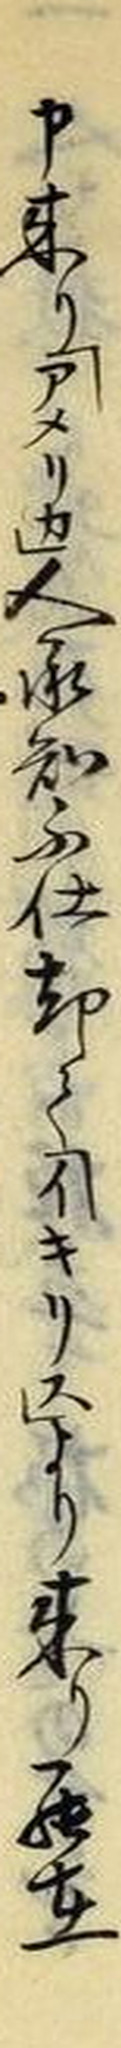申来り「アメリカ」人承知不仕却て「イキリス」より来り罷在
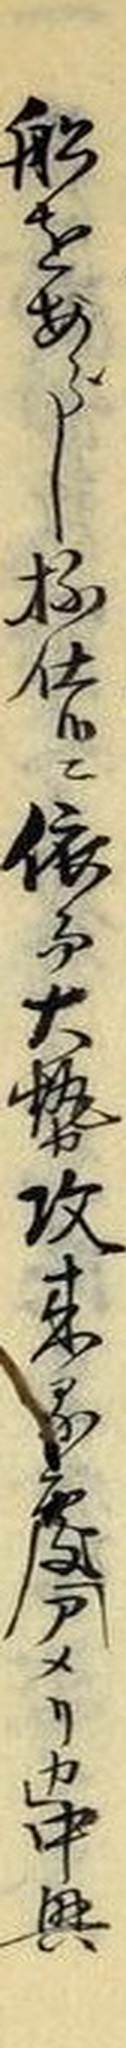船をあらし抔仕候ニ依而大勢攻来る處「アメリカ」中興
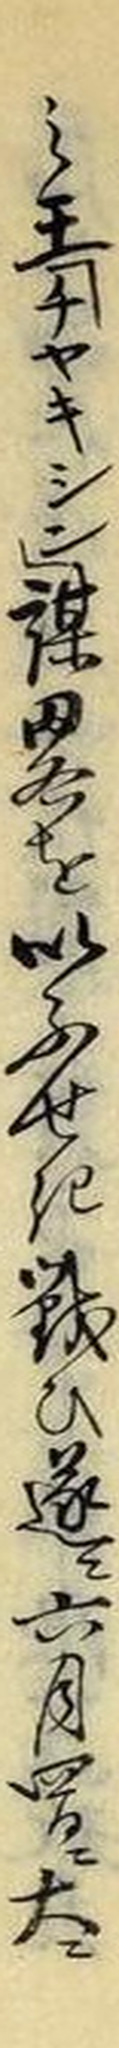之王「チヤキシン」謀略を以ふせき戦ひ遂ニ六月四日ニ大ニ
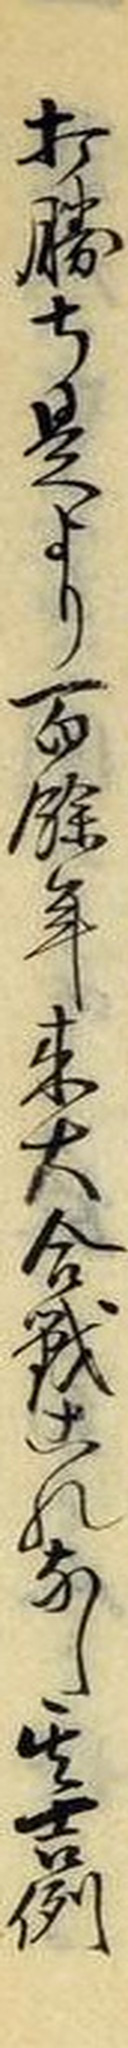打勝ち是より百余年来大合戦これなし其吉例
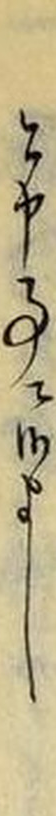と申事ニ候よし
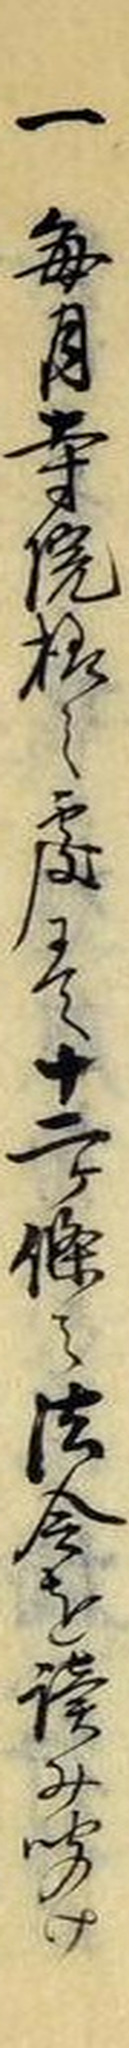一毎月寺院様の處にて十二ヶ條之法令を読み聞け
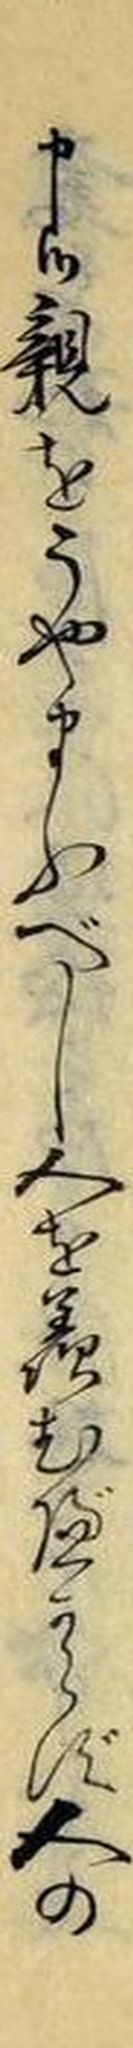申候親をうやまふべし人を羨むべからず人の

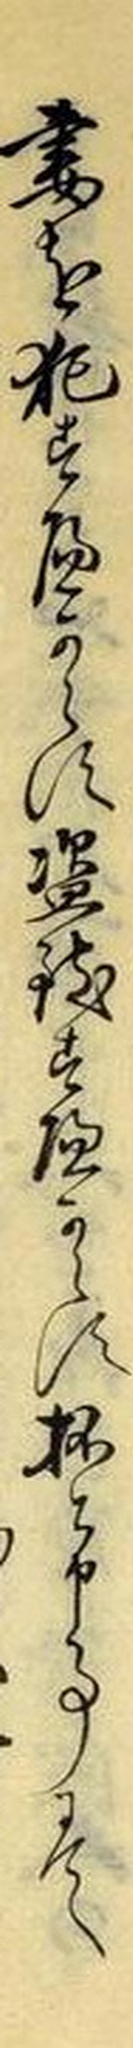妻を犯すへからす盗致すへからす抔と申事にて
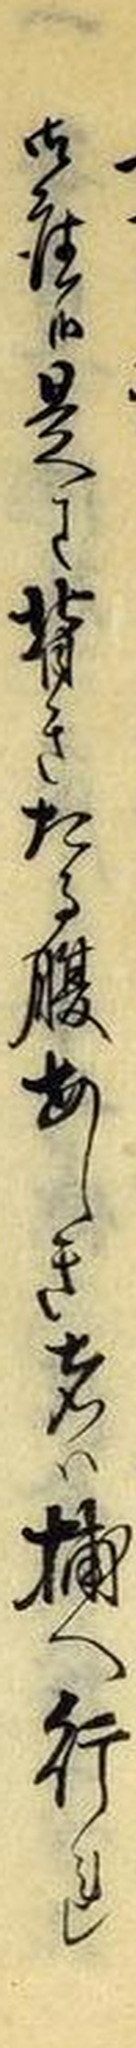御座候是に背きたる腹あしき者はハ捕へ行れ
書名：漂客談奇（備考雑録写8）
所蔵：福井県文書館 Fukui Prefectural Archives
